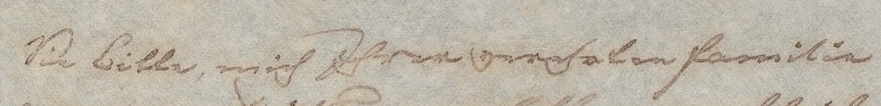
Sie bitte, mich Ihrer verehrten Familie
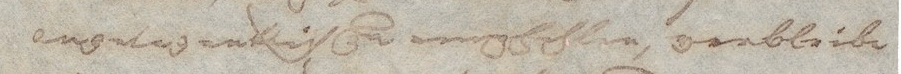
angelegentlich zu empfehlen, verbleibe
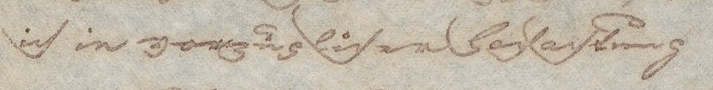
ich in vorzüglicher Hochachtung
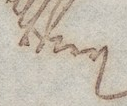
Zürich
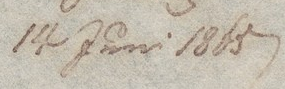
14 Juni 1865
